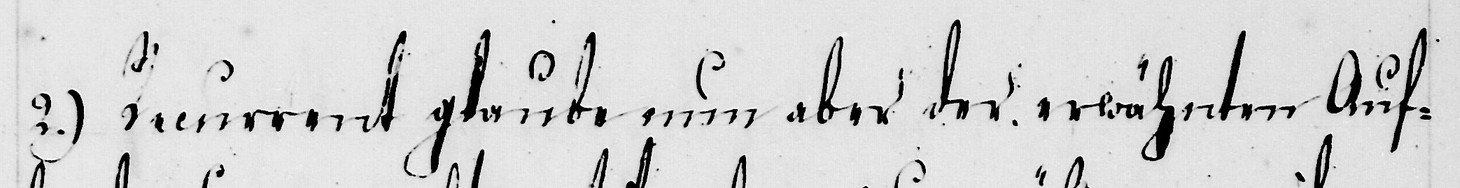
2.) Recurrent glaube nun aber der erwähnten Auf¬
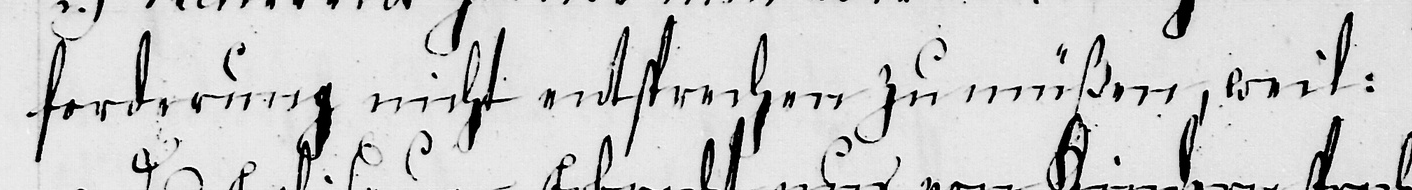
forderung nicht entsprechen zu müßen, weil:
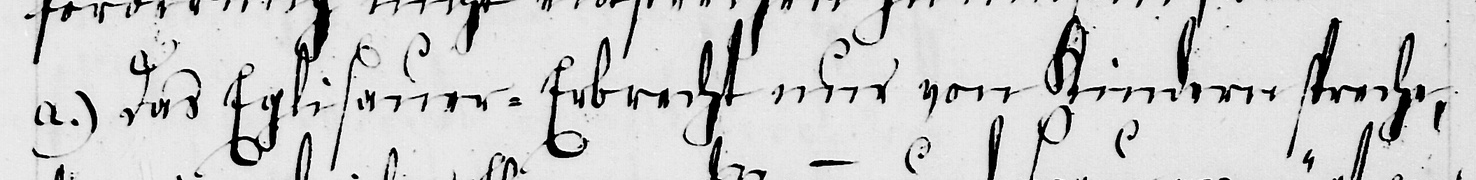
a.) Das Eglisauer-Erbrecht nur von Kindern spreche,
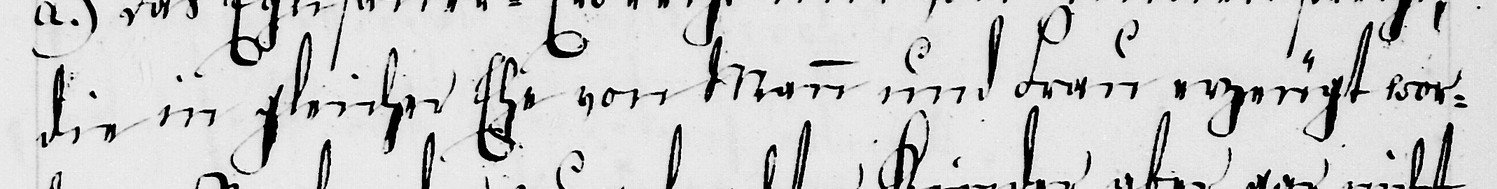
die in gleicher Ehe von Mann und Frau erzeugt wor¬
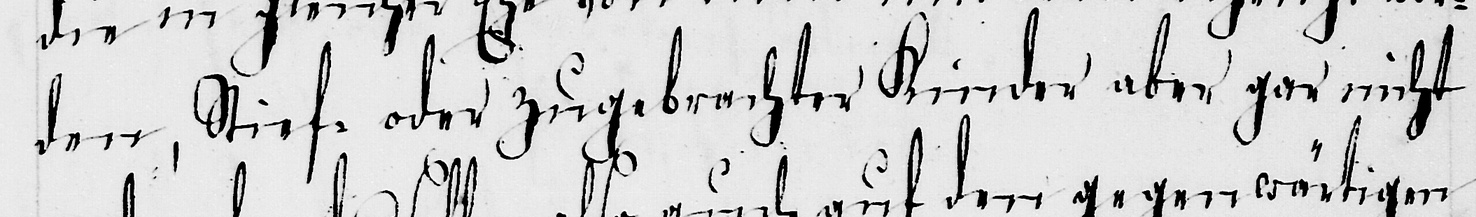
den, Stief- oder zugebrachter Kinder aber gar nicht
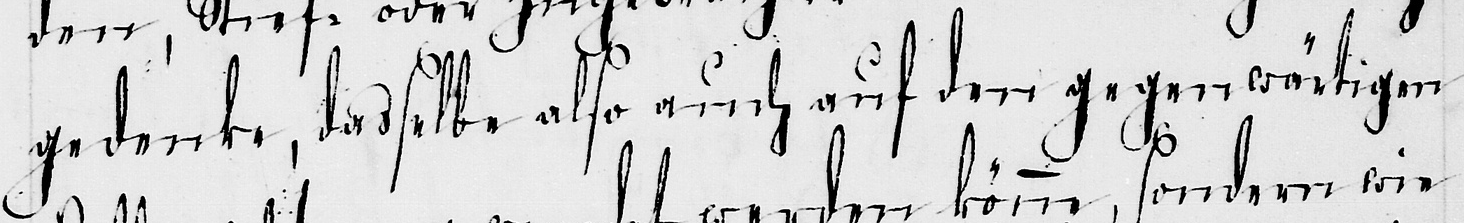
gedenke, dasselbe also auch auf den gegenwärtigen
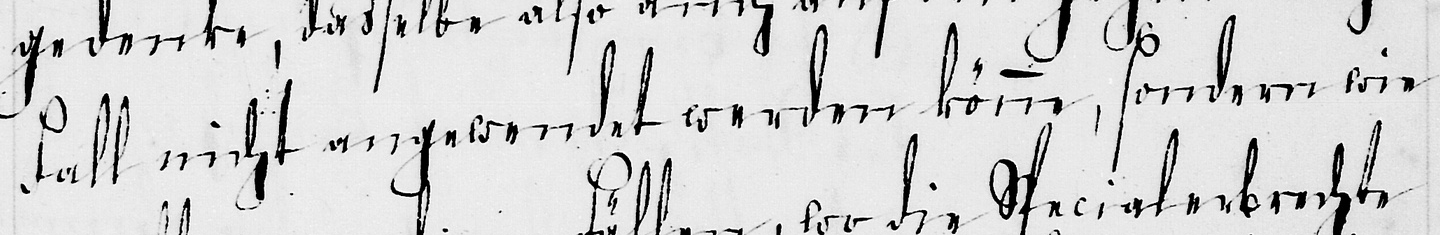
Fall nicht angewendet werden könne, sondern wie
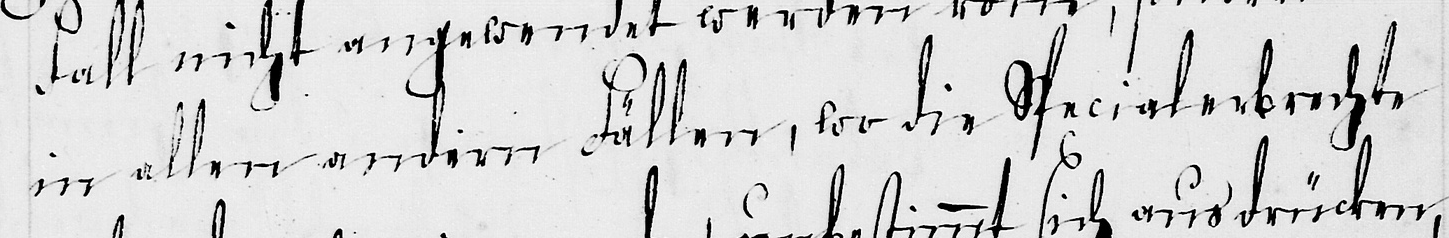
in allen andern Fällen, wo die Specialerbrechte
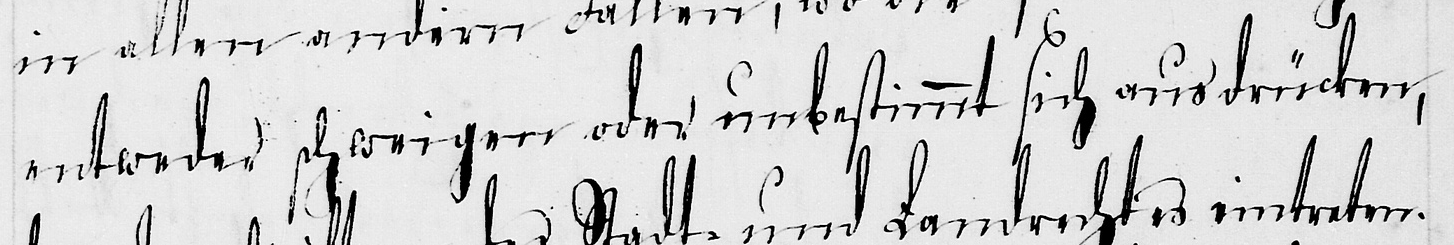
entweder schweigen oder unbestimmt sich ausdrücken,
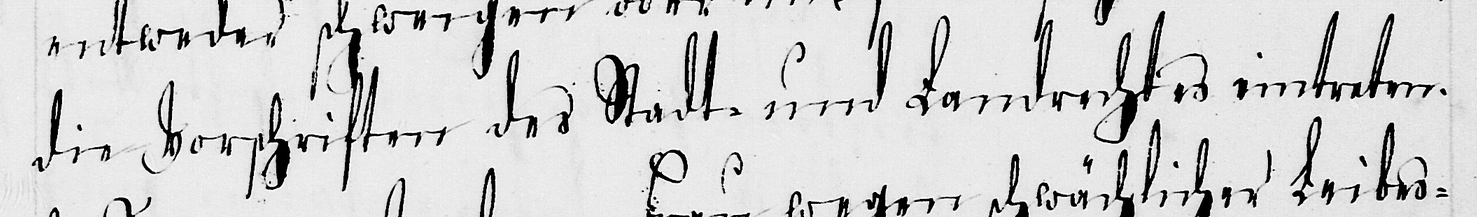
die Vorschriften des Stadt- und Landrechtes eintreten.
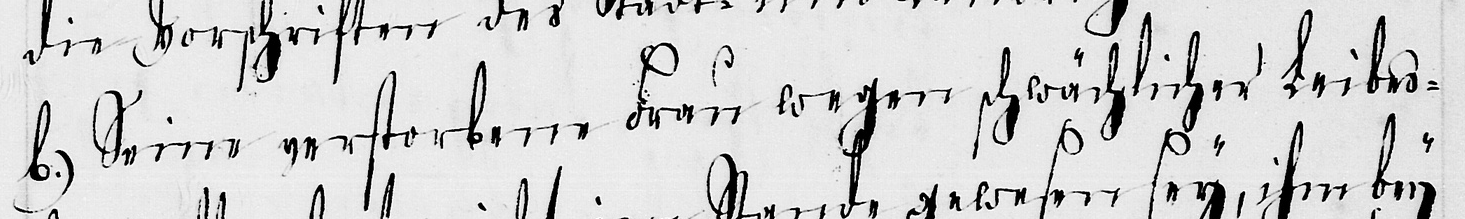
b.) Seine verstorbene Frau wegen schwächlicher Leibes¬
